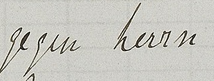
gegen Herrn
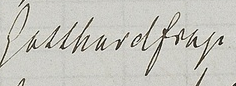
Gotthardfrage
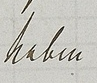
Melegari
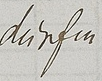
nichts
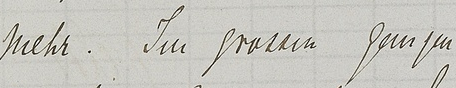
mehr. Im grossen ganzen
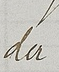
wir
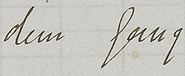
dem Gang der
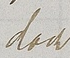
Monate
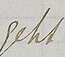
geht
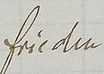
langsam
